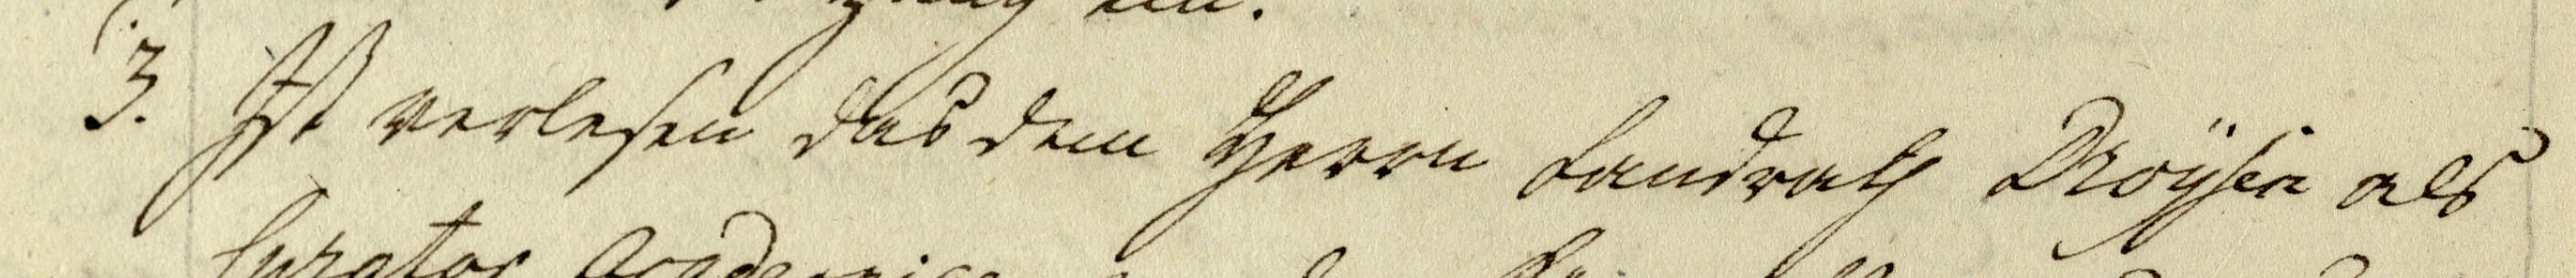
3. Ist verlesen das dem Herrn Landrath Droÿsen als
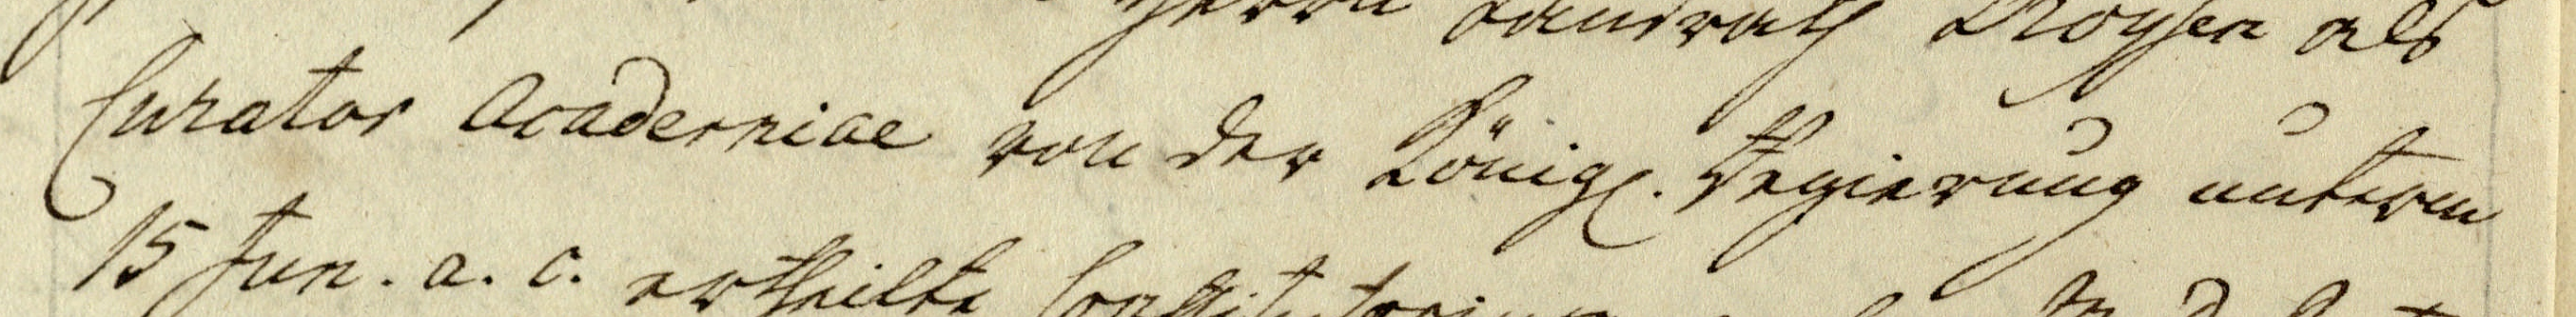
Curator Academiae von der Königl. Regierung unterm
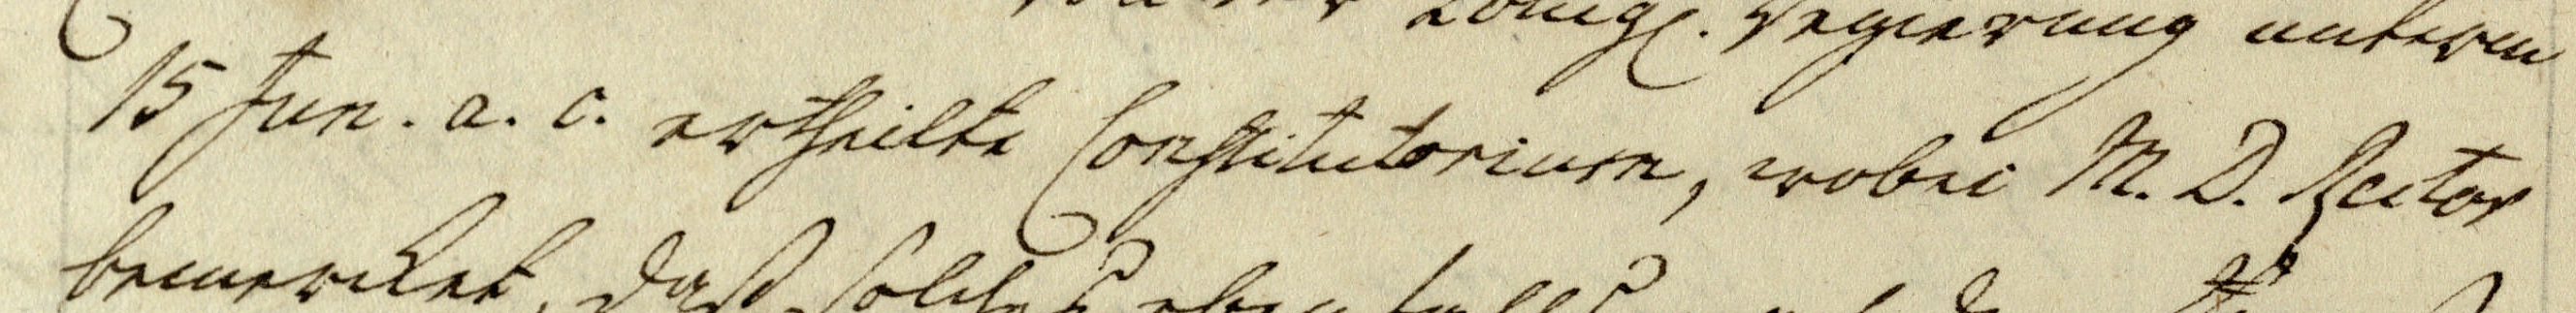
15 Jun. a. c. ertheilte Constitutorium, wobei M. D. Rector
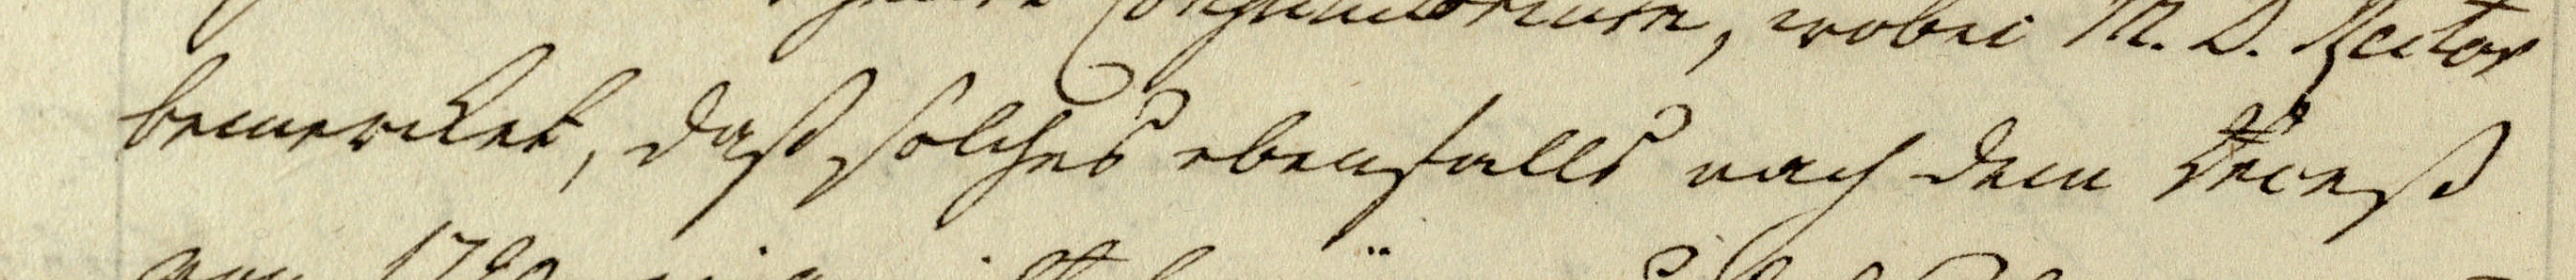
bemercket, daß solches ebenfalls nach dem Receß
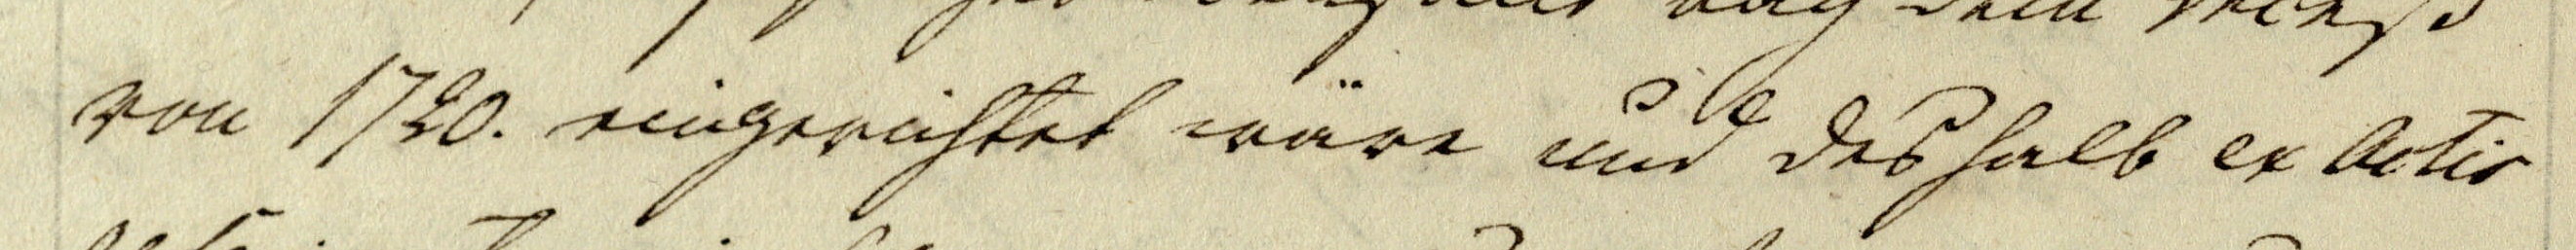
von 1720. eingerichtet wäre und deshalb ex Actis
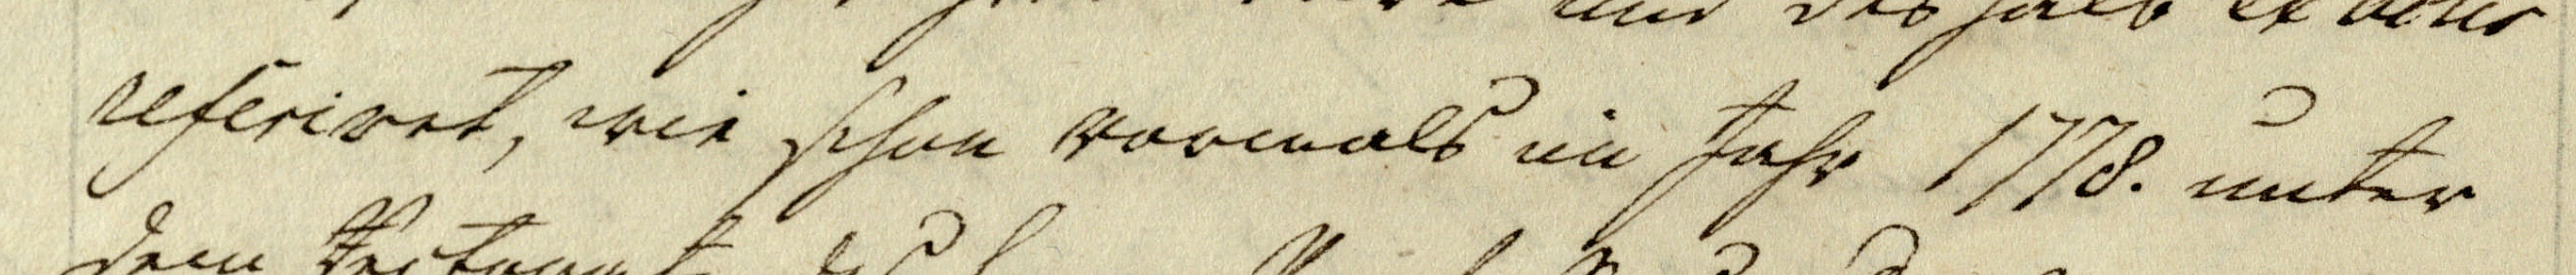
referiret, wie schon vormals in Jahr 1778. unter
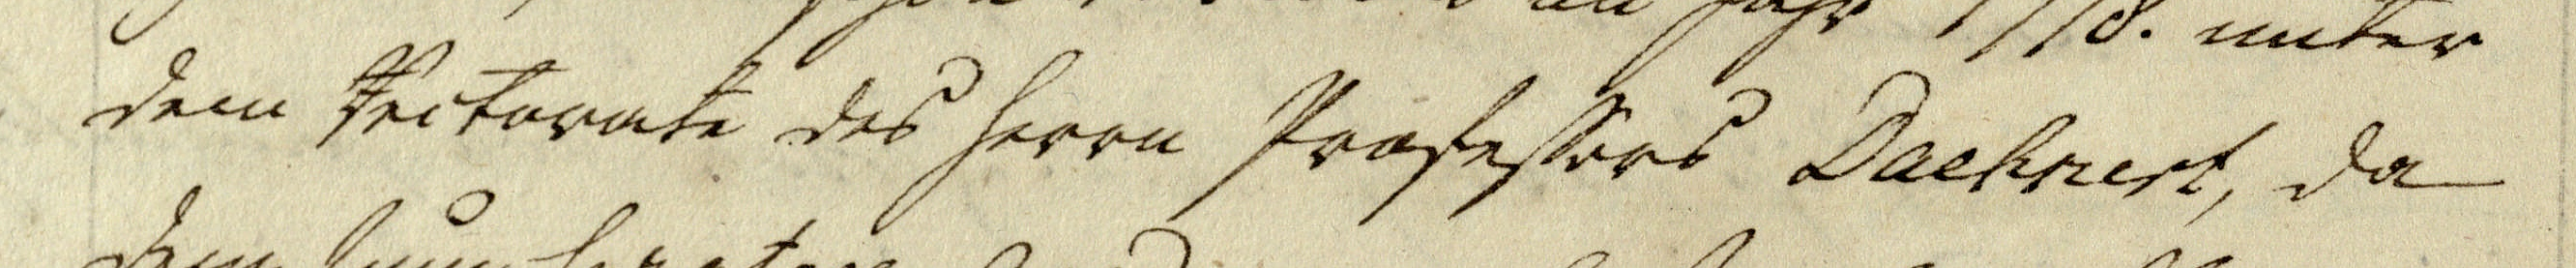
dem Rectorate des Herrn Professors Daehnert, da
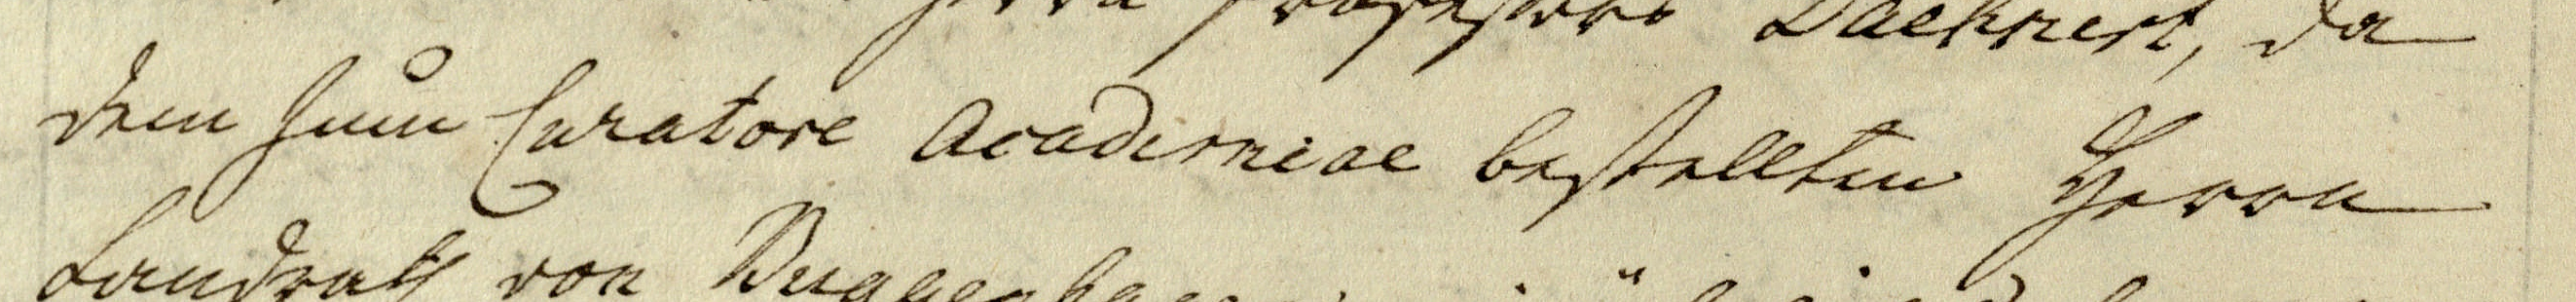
dem zum Curatore Academiae bestellten Herrn
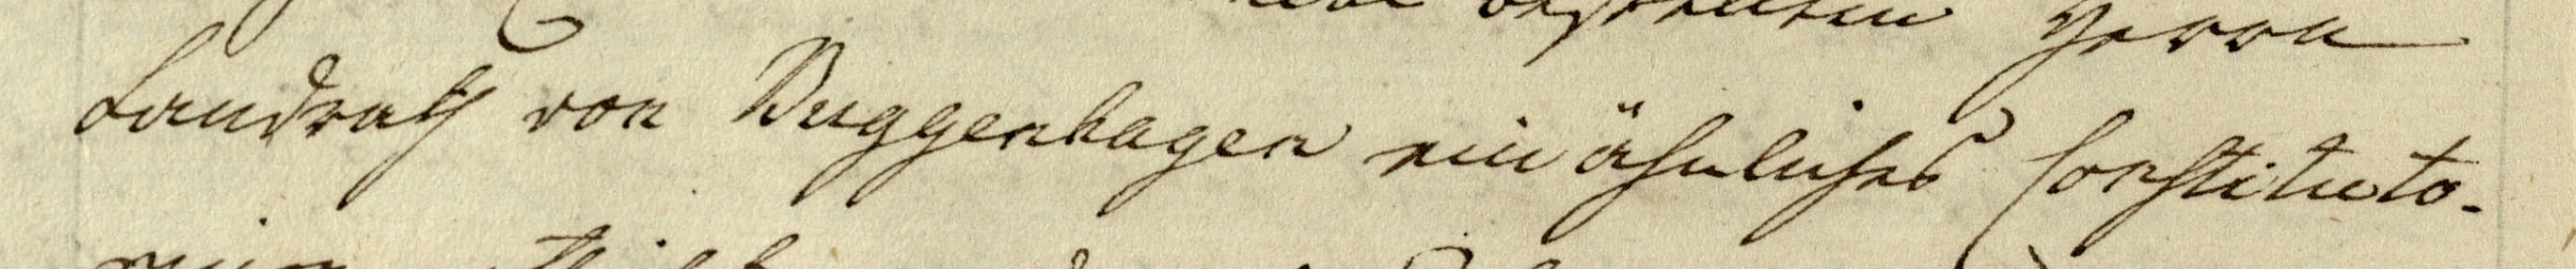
Landrath von Buggenhagen ein ähnliches Constituto¬
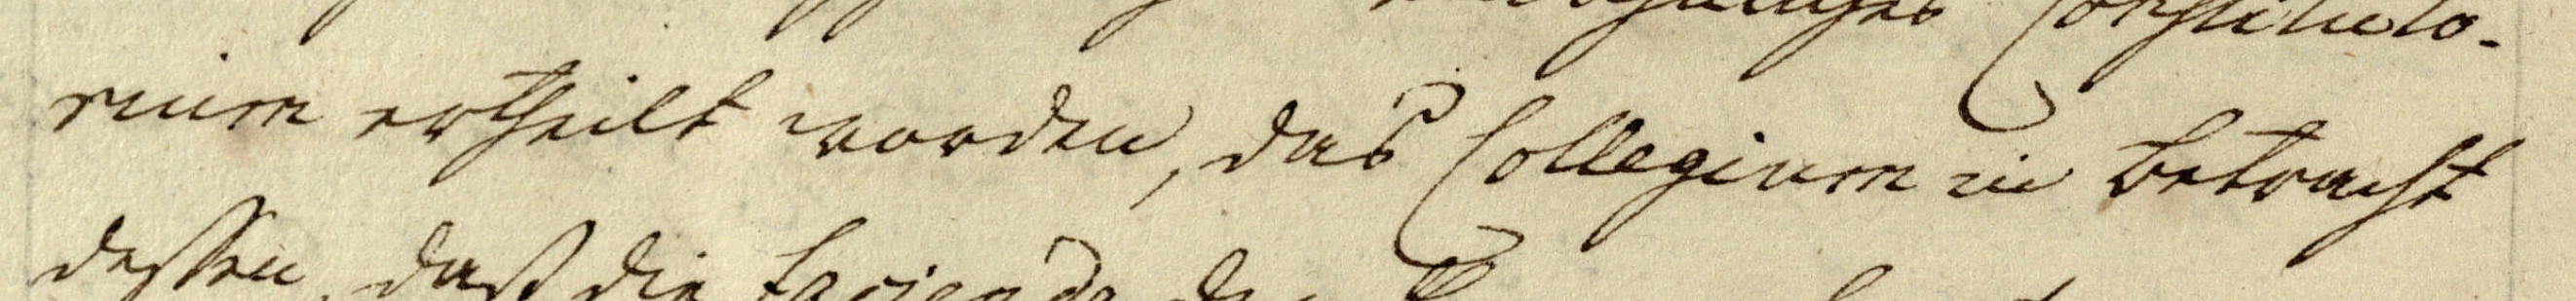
rium ertheilt worden, das Collegium in Betracht
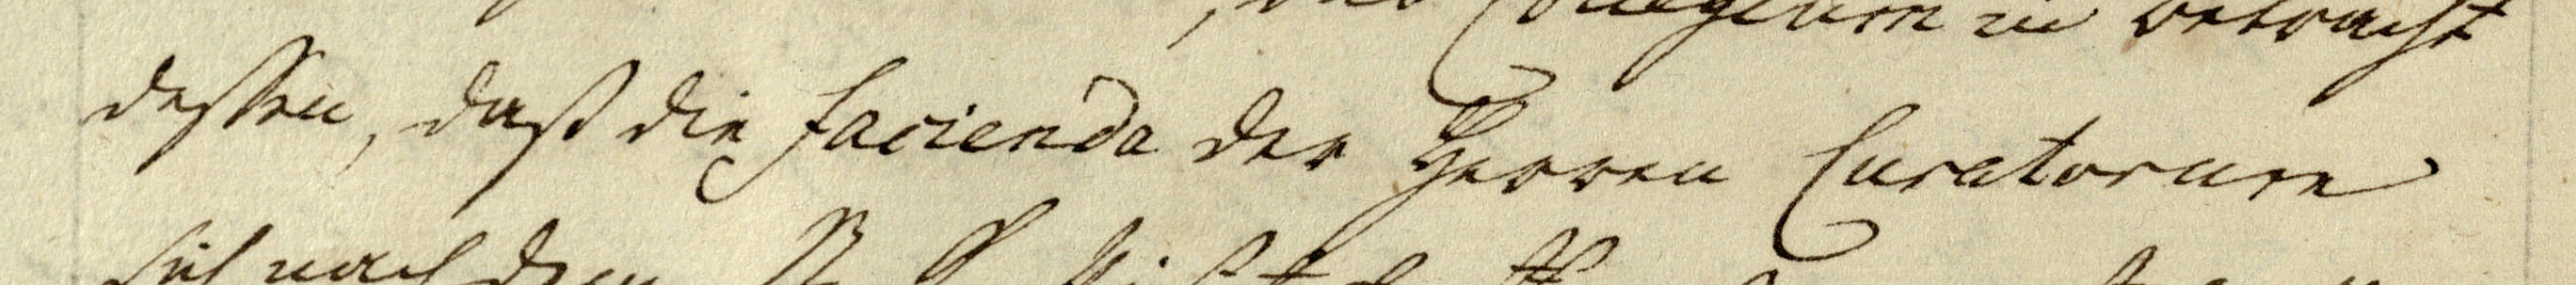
dessen, daß die Facienda der Herren Curatorum
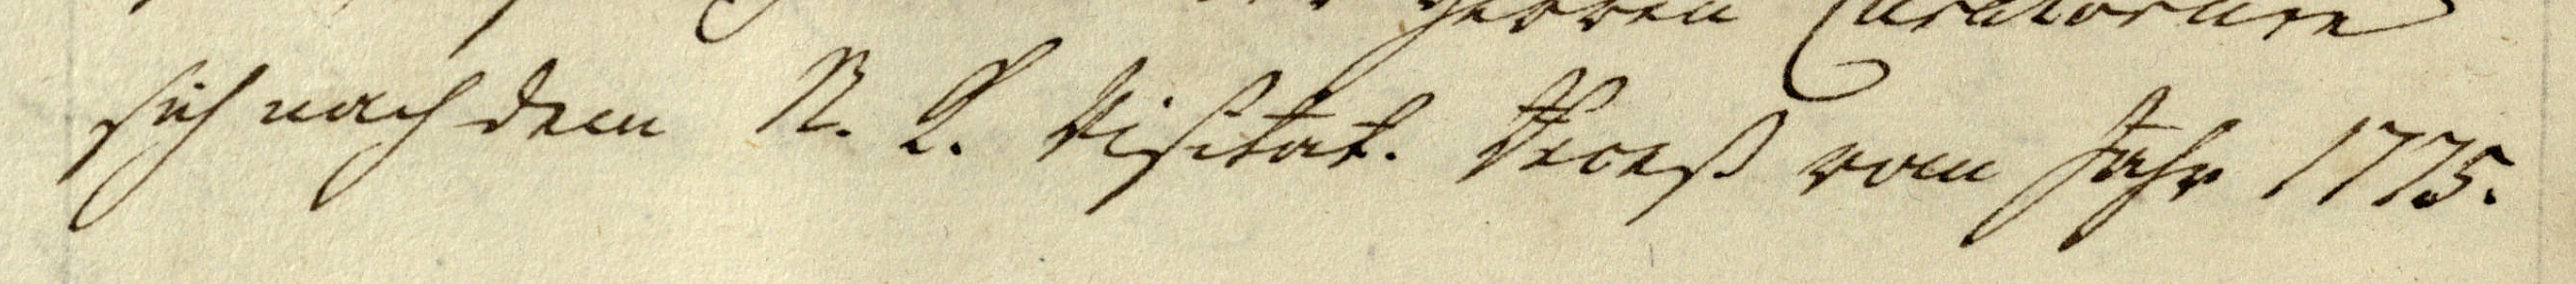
sich nach dem N. K. Visitat. Receß vom Jahr 1775.
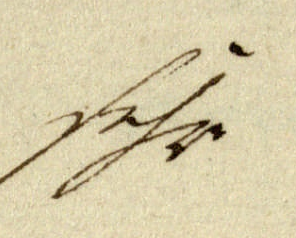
sehr
